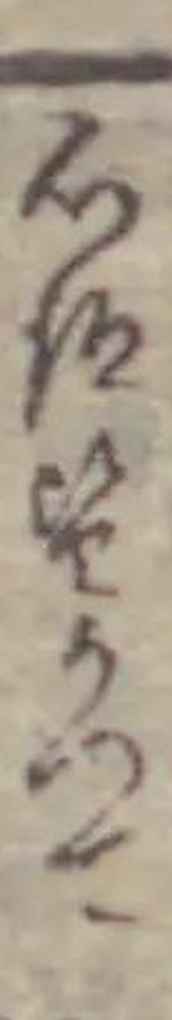心得皆かつて
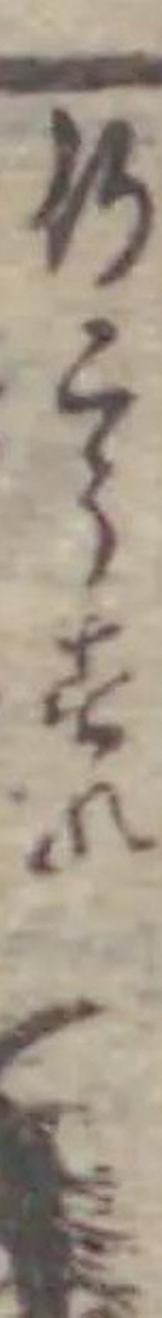行こうすれ
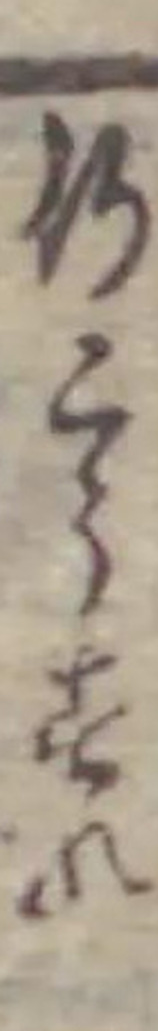行こうすれ
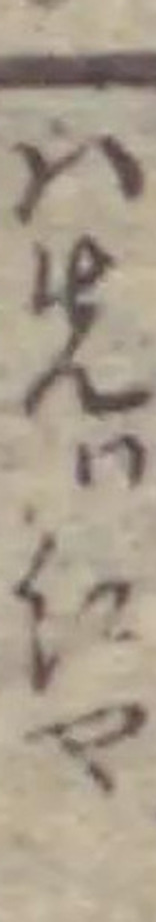は先は紅や
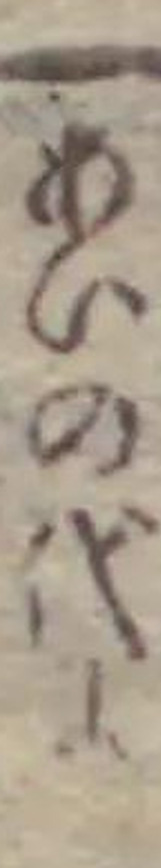あいの代に
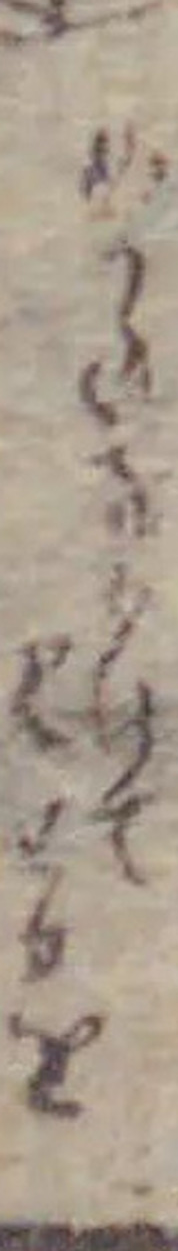めかねをかけて
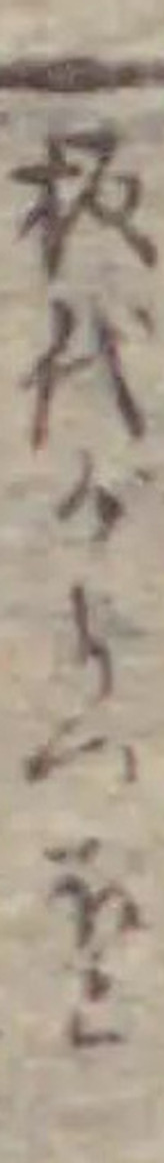板代がよつほと
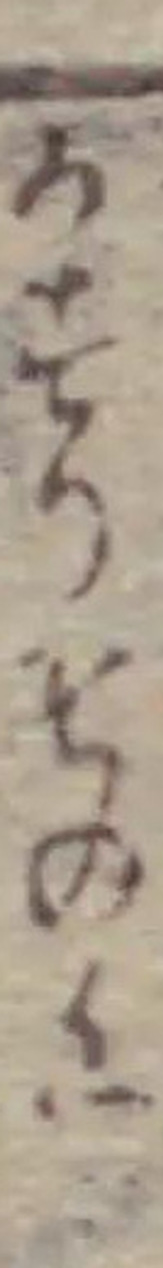かすり其の上
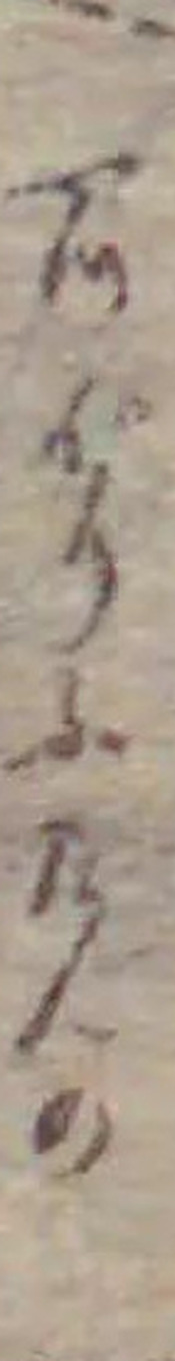やつはりふたんの
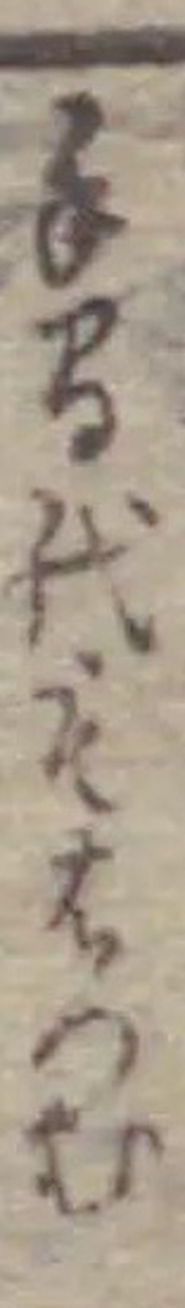手間代もはつむ
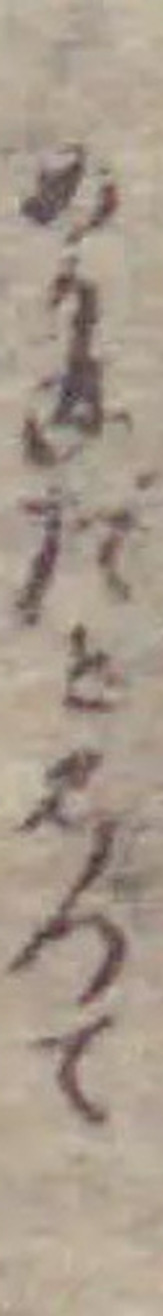めかねだとしつて
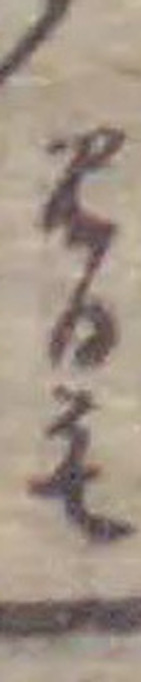見るも
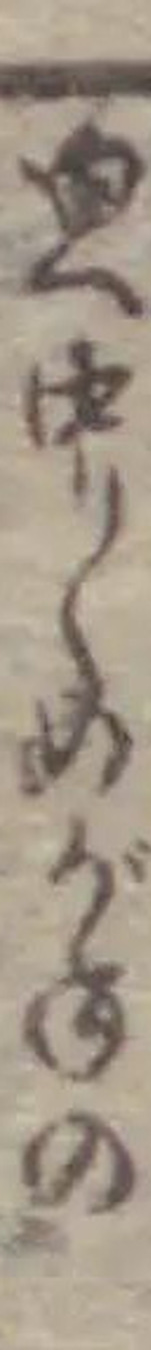ゆへ中〳〵めがねの
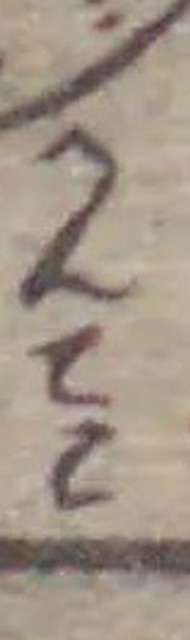へんてこ
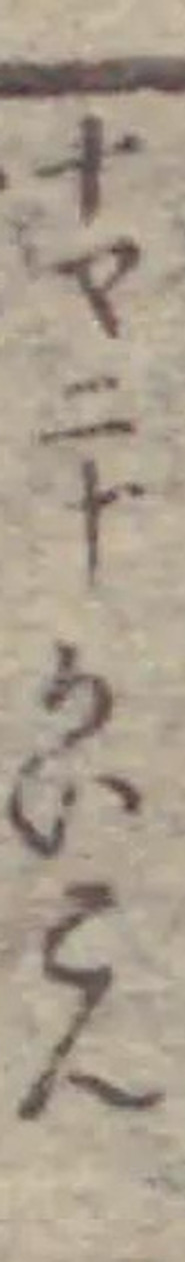十や二十かいこん
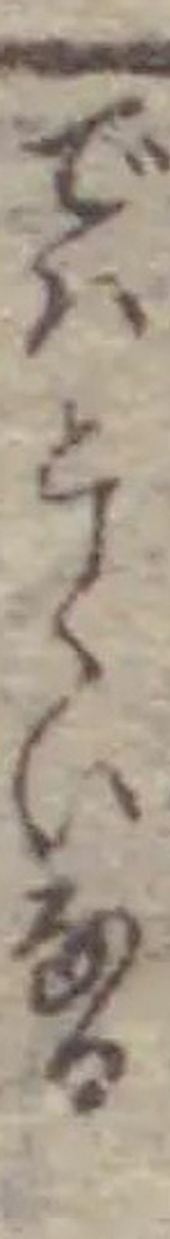ではとくいなる
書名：栄増眼鏡徳 3巻
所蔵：国立国会図書館 National Diet Library, JAPAN
